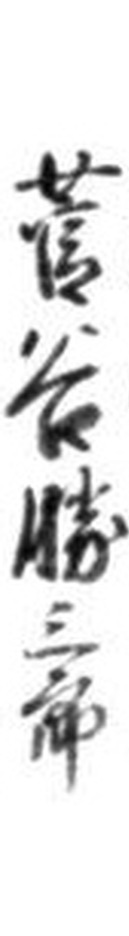菅谷勝三郎
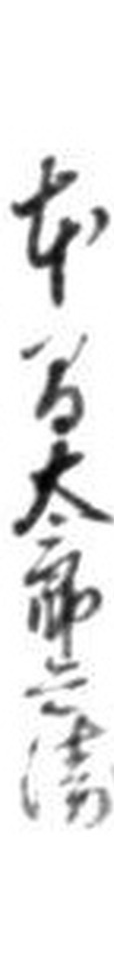本間太郎兵衛
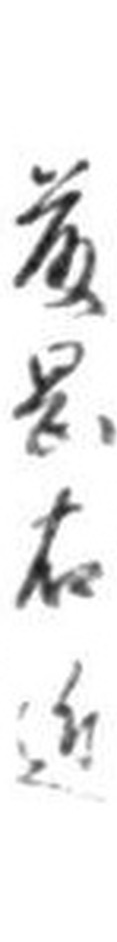藤岡右近
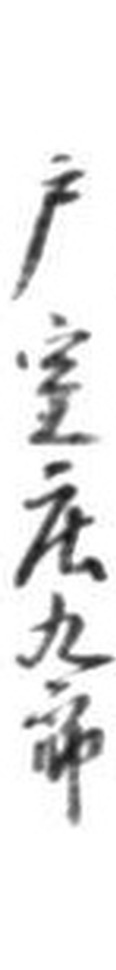戸室庄九郎
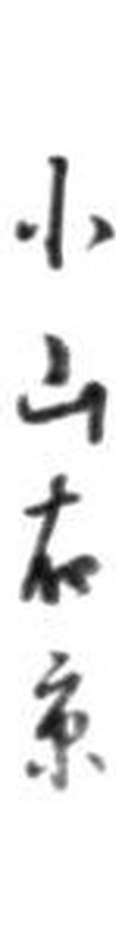小山右京
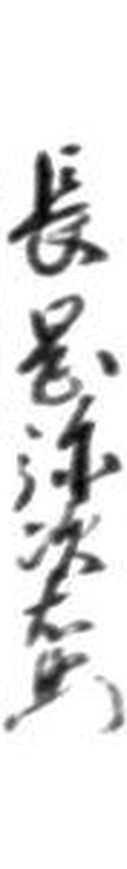長岡弥次右衛門
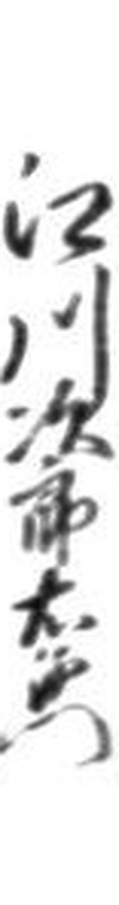江川次郎右衛門
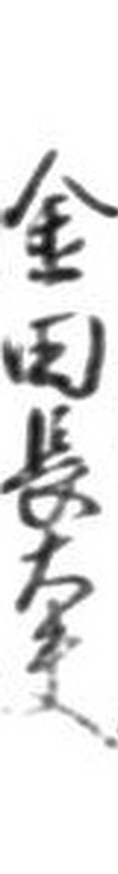金田長大夫
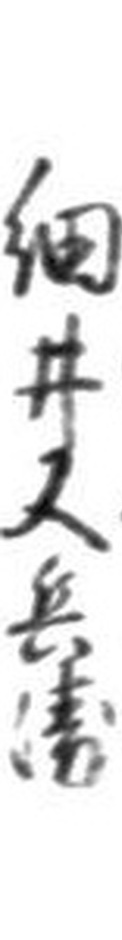細井又兵衛
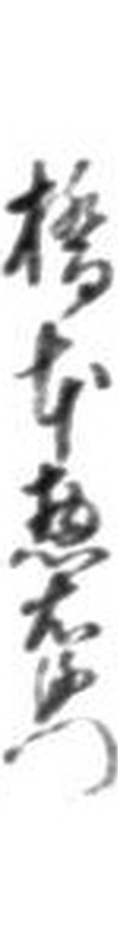橋本惣右衛門
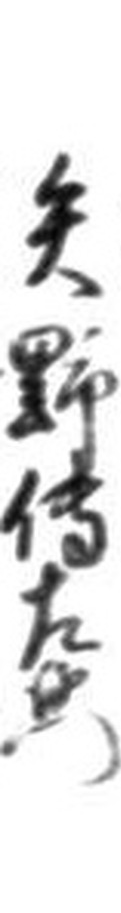矢野伝左衛門
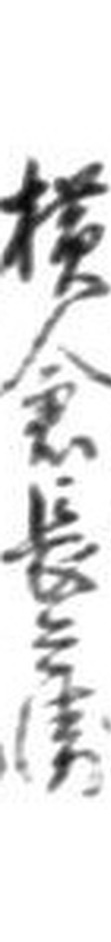横倉長兵衛
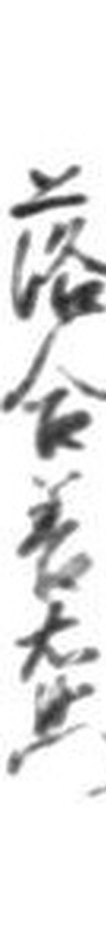落合善右衛門
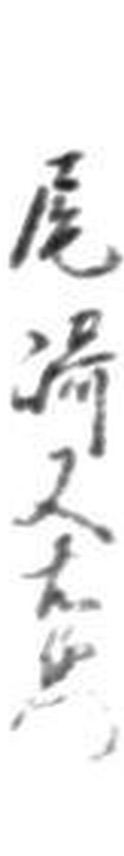尾崎又右衛門
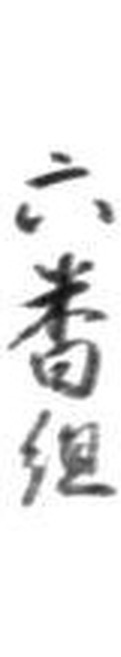六番組
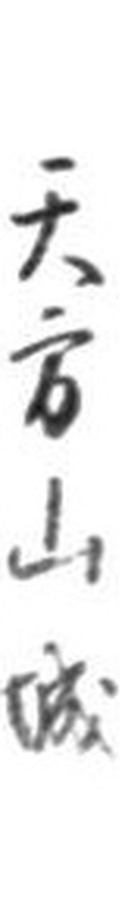天方山城
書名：家譜 二 忠直公 従文禄四年到慶安四年
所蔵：福井県文書館 Fukui Prefectural Archives
